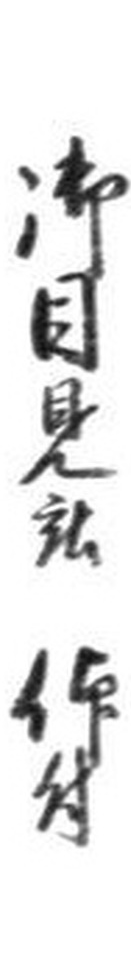御目見被仰付

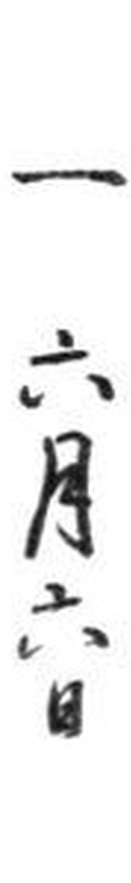一六月六日
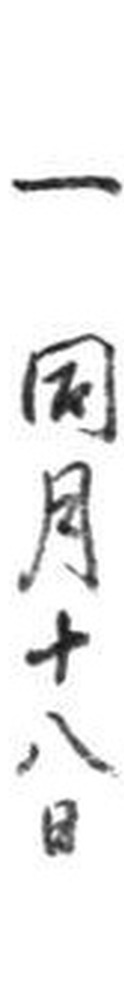一同月十八日
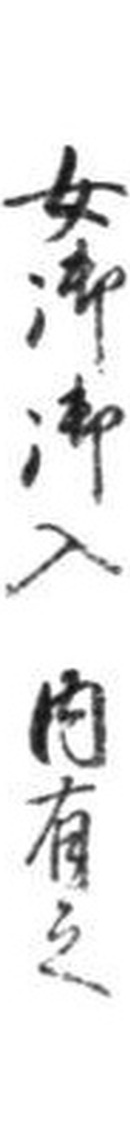女御御入内有之
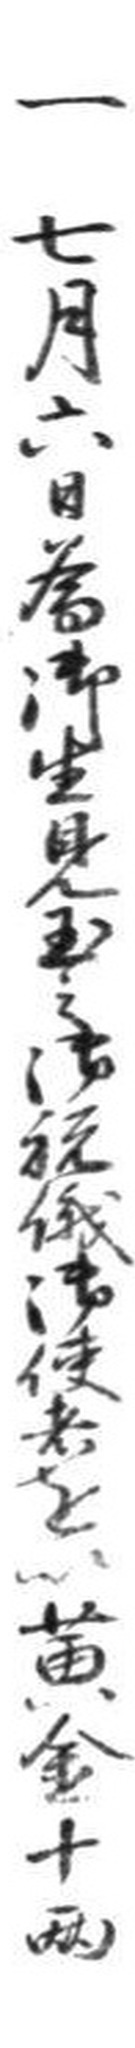一七月六日為御生見玉之御祝儀御使者を以黄金十両
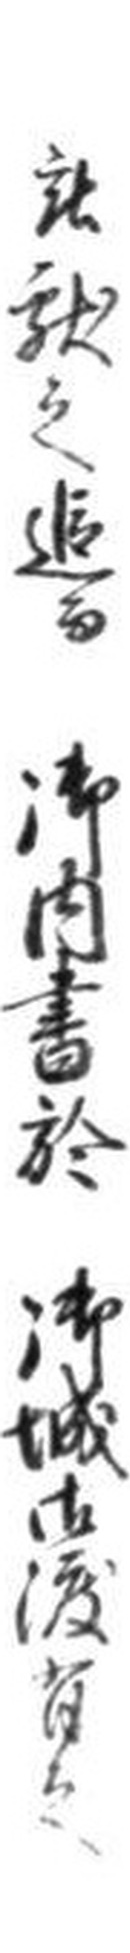被献之追而御内書於御城御渡有之
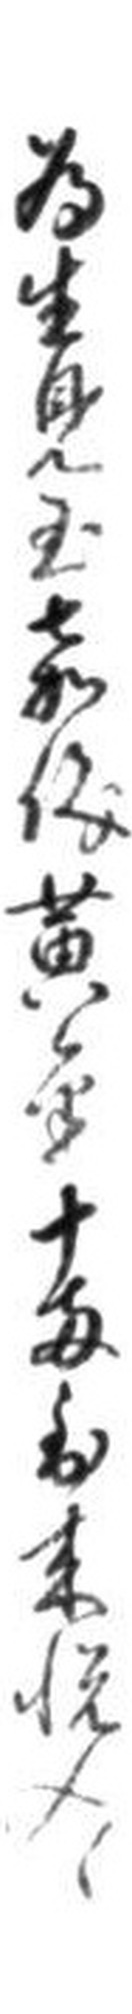為生見玉嘉儀黄金十両至来悦入候
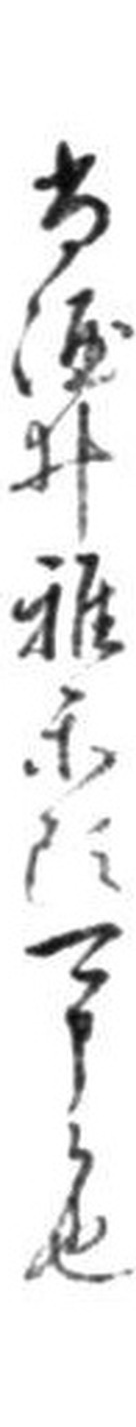尚酒井雅樂頭可申候也
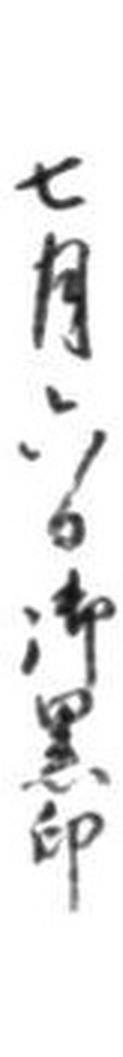七月六日御黒印
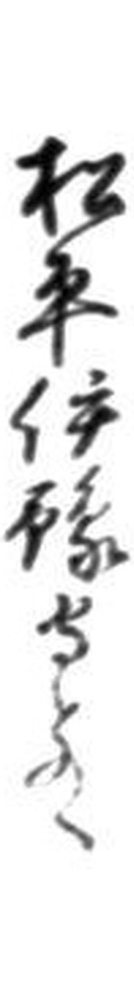松平伊予守とのへ

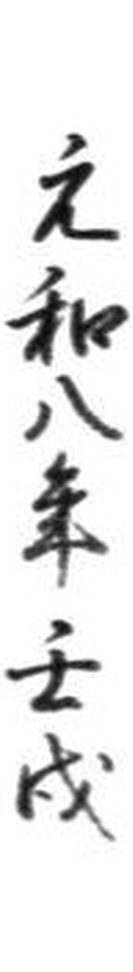元和八年壬戌
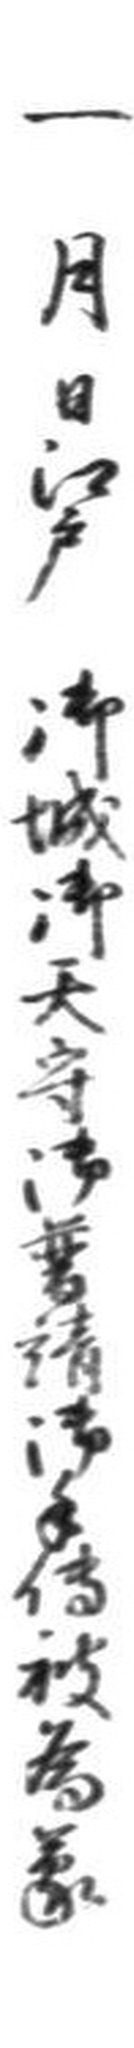一月日江戸御城御天守御普請御手伝被為蒙
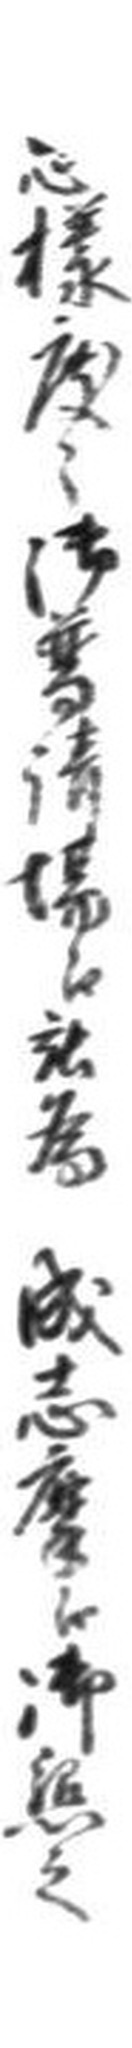様度々御普請場江被為成志摩江御懇之
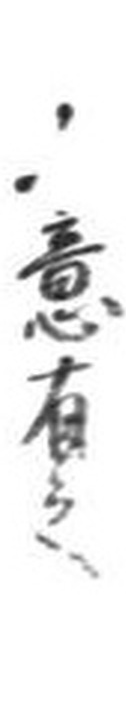意有之
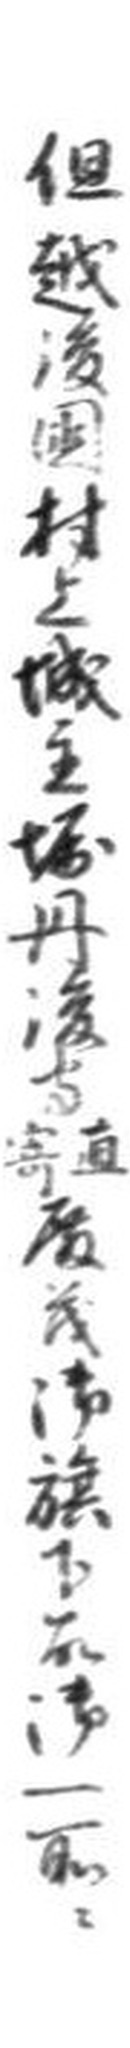但越後国村上城主堀丹後守直寄殿も御旗下故御一所ニ
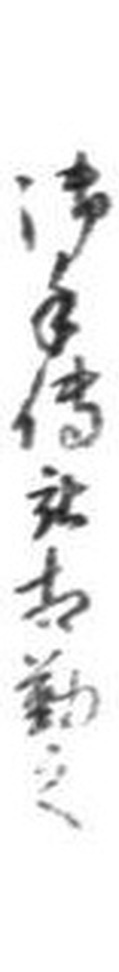御手伝被相勤之
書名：家譜 三 忠昌公 従慶長八年到寛永六年
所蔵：福井県文書館 Fukui Prefectural Archives
